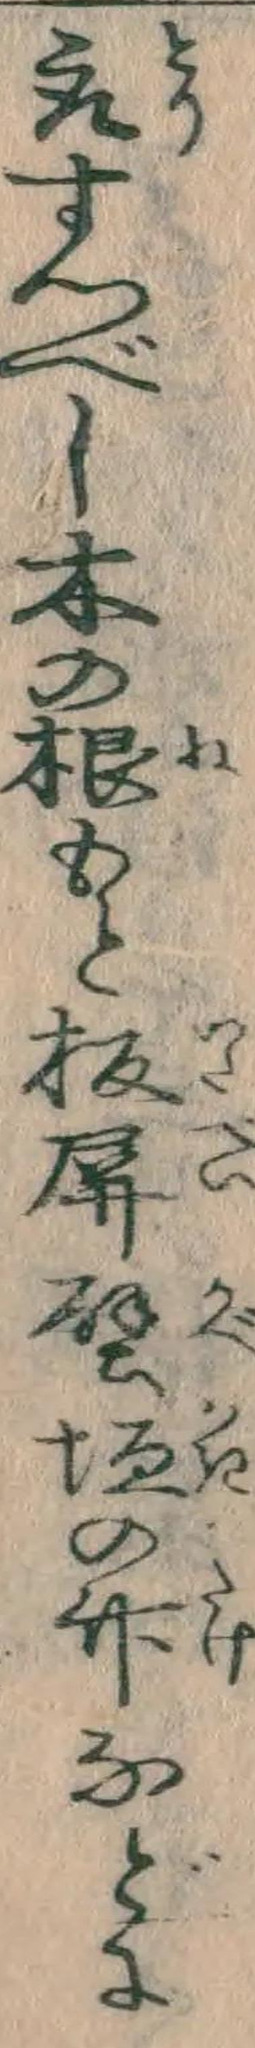取すつべし木の根もと板屏壁垣の竹などに
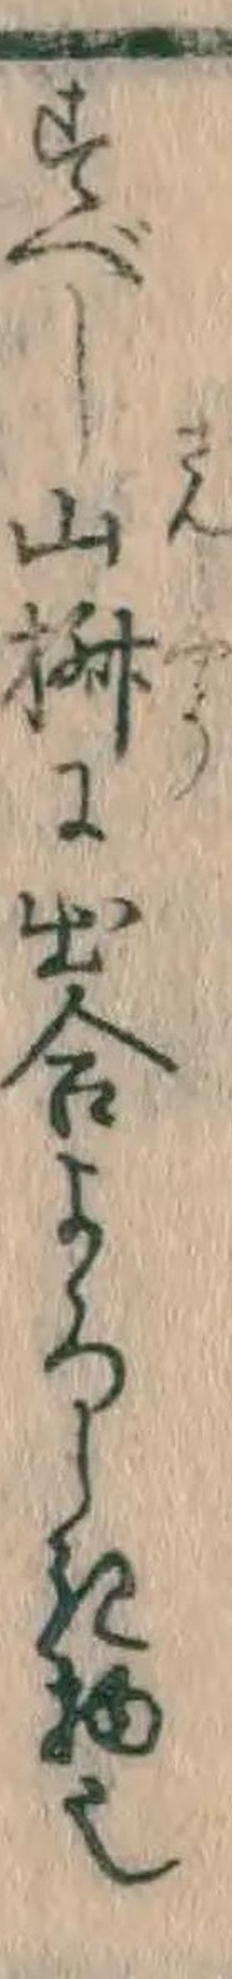すべし山椒に出合よろしき物也
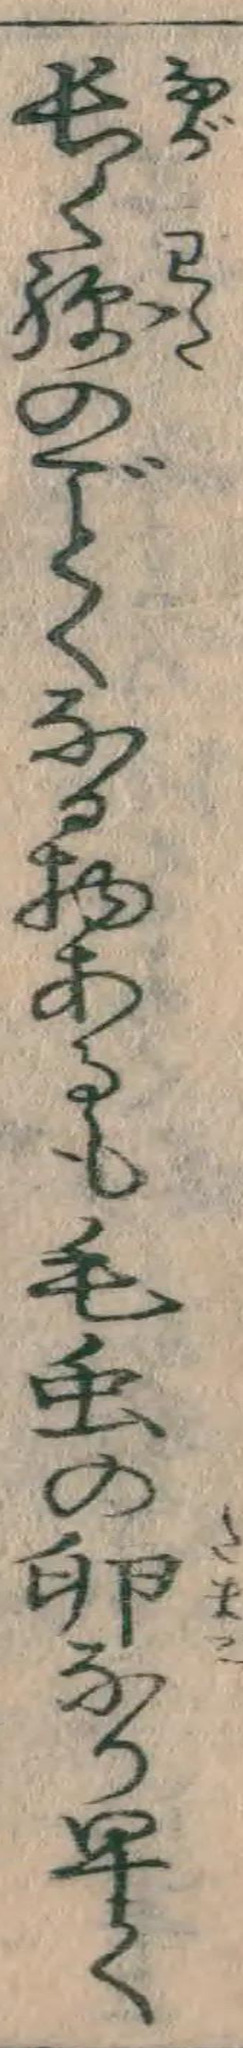長く綿のごとくなる物あるも毛虫の卵なり早く
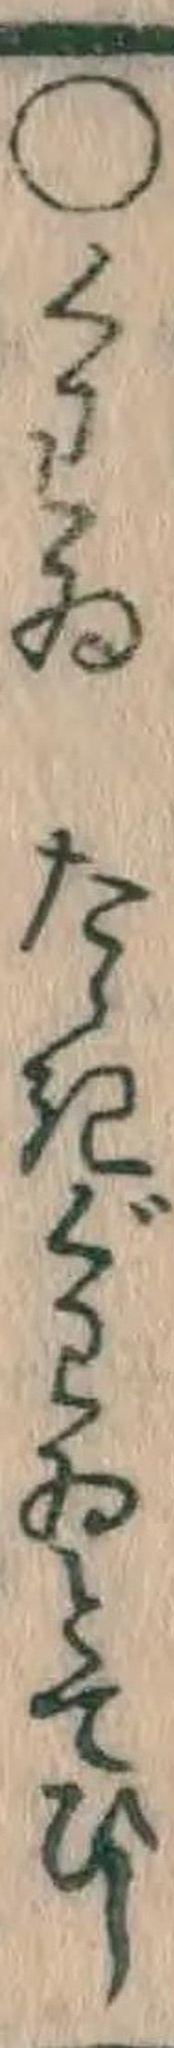○くわゐたゝきぐわゐとてひし
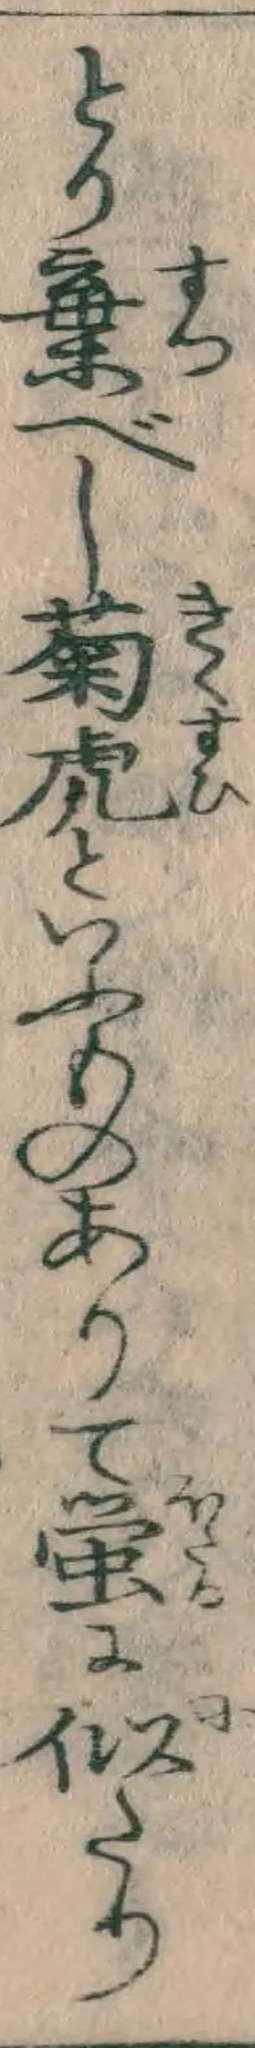とり棄べし菊虎といふものありて螢に似たり
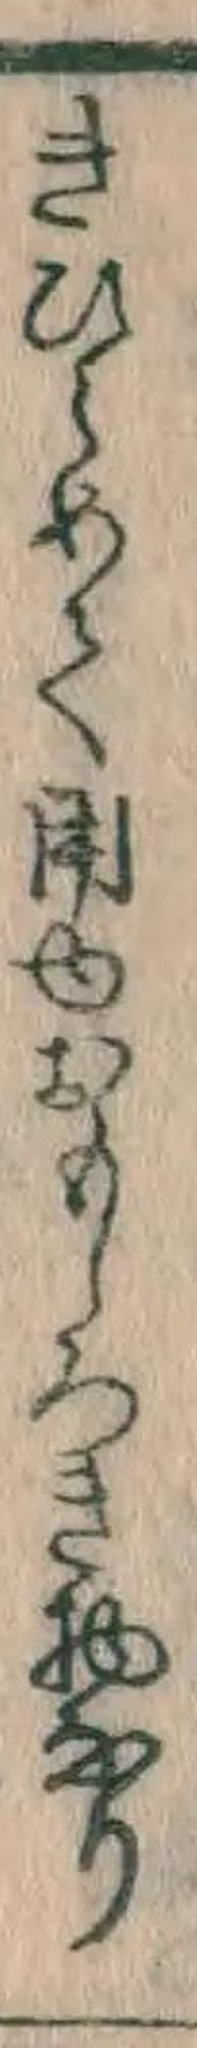きひらめて用ゆおもしろき物なり
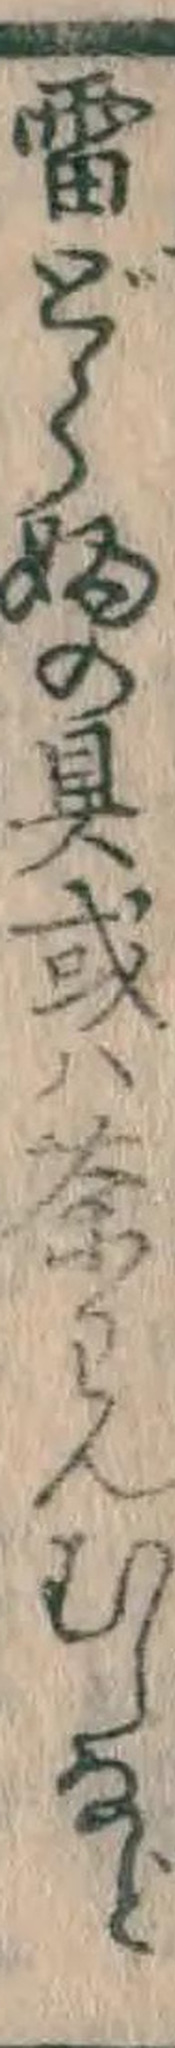雷どうふの具或は茶わんむしなど
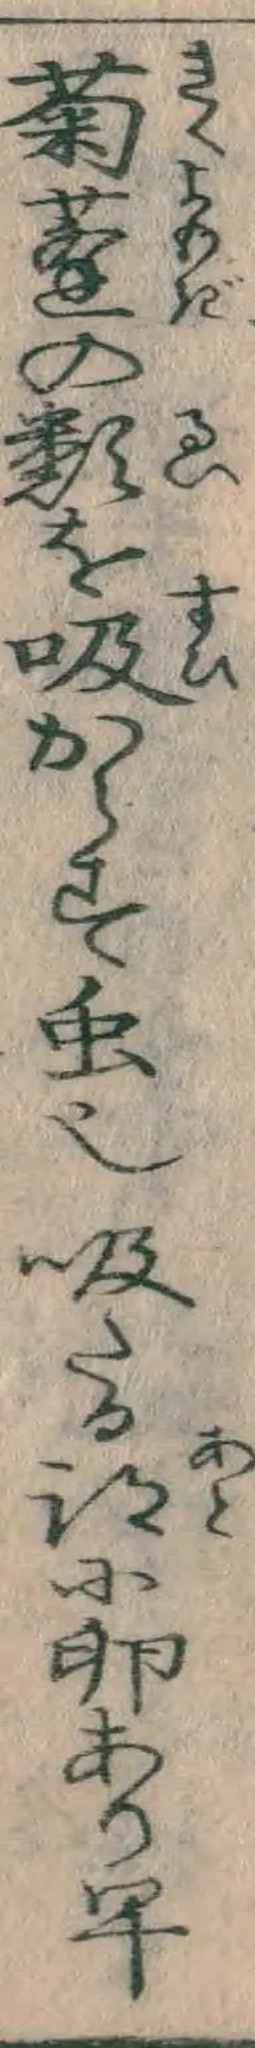菊蓬の類を吸からす虫也吸たる跡に卵あり早
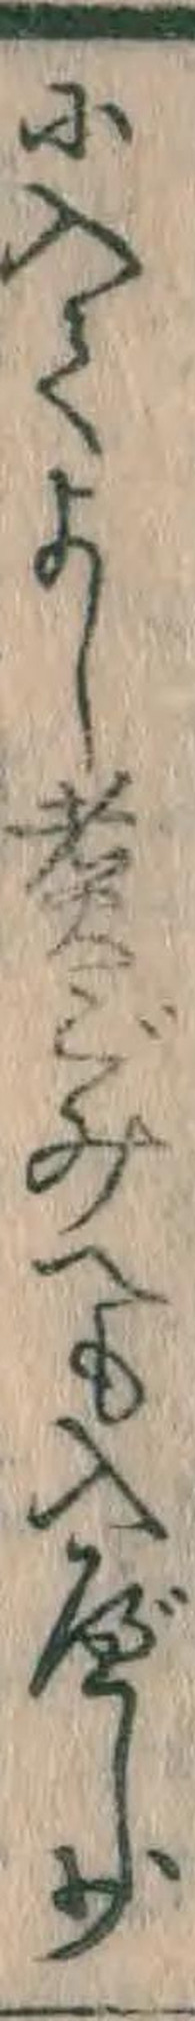に入てよし煮ごみへも入べし少
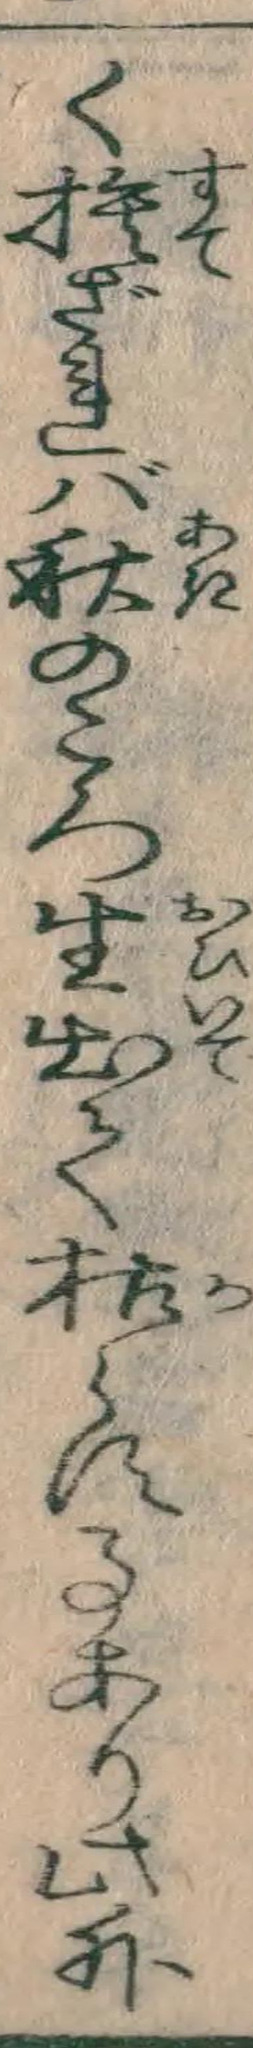く捨ざれば秋のころ生出て枯らす事あり此外
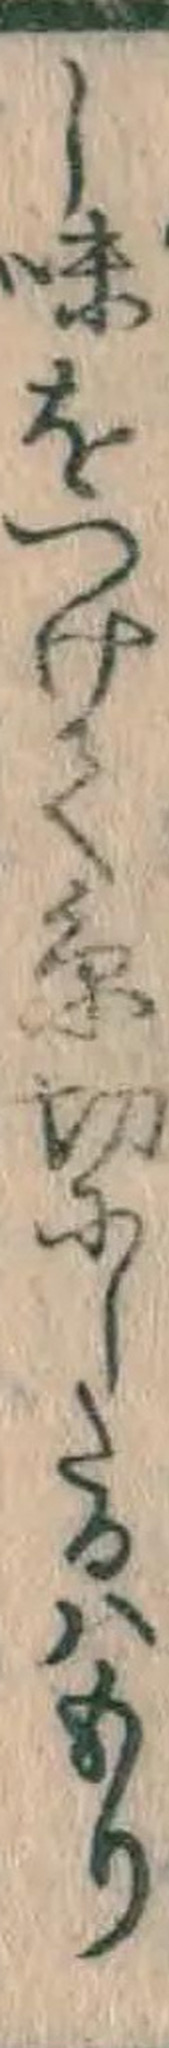し味をつけて糸切にしたるはもり
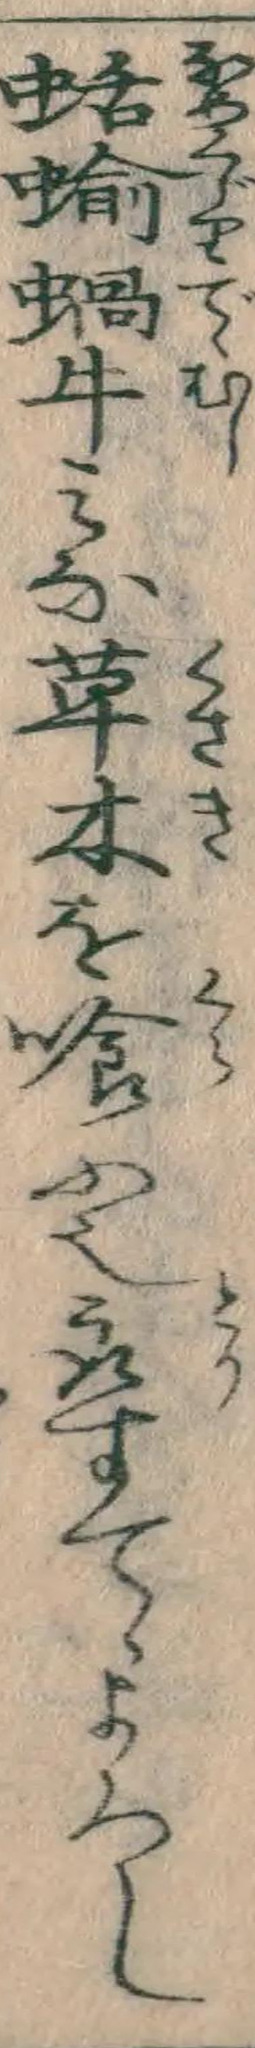蛞蝓蝸牛みな草木を喰ふ也取すてゝよろし
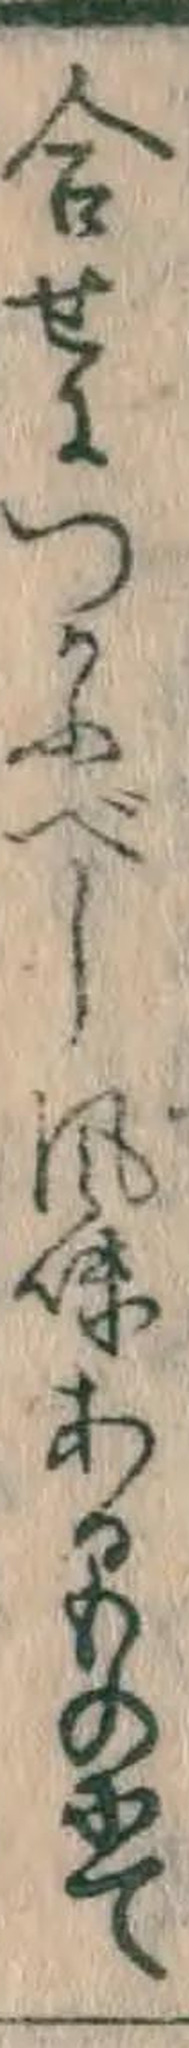合せにつかふべし風味あるものにて
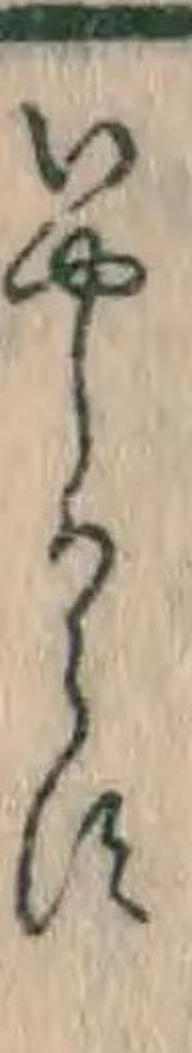いやしからす
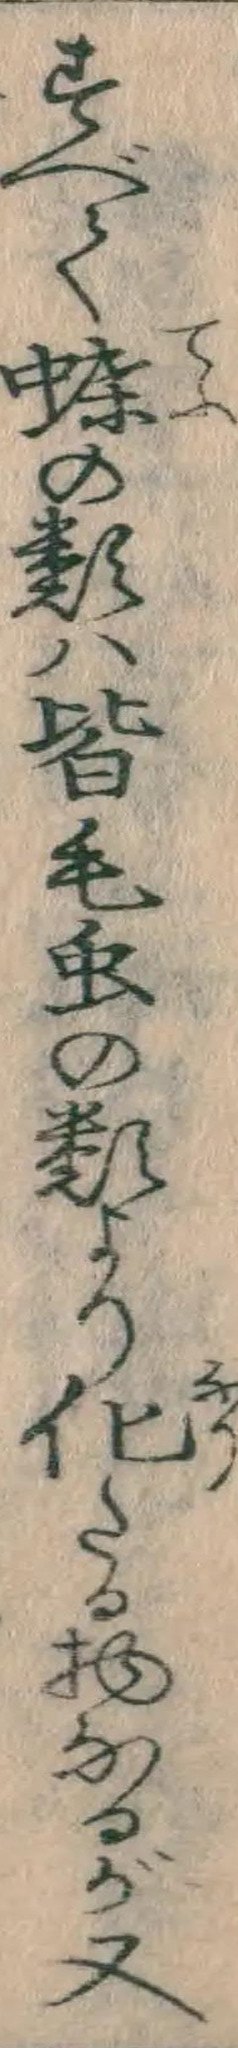すべて蝶の類は皆毛虫の類より化たる物なるが又
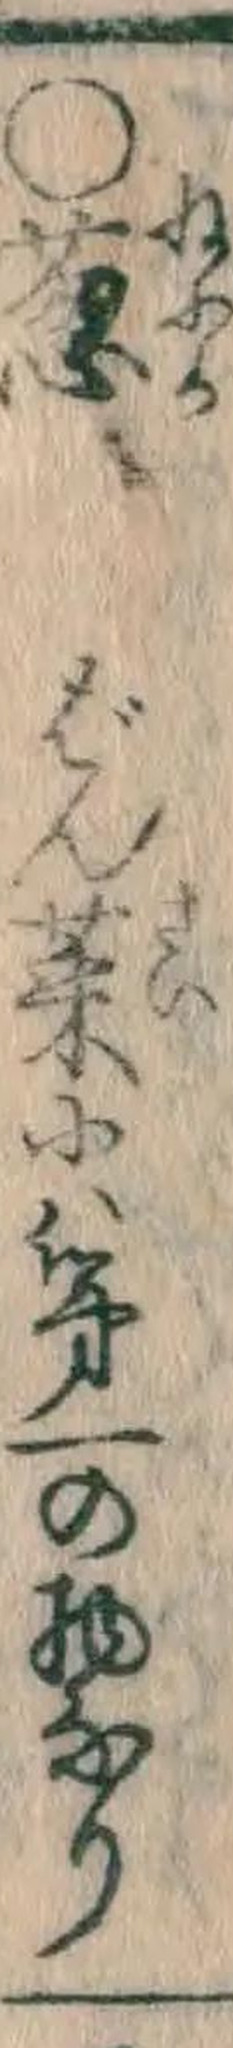○葱ばん菜には第一の物なり
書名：広益秘事大全 3巻. [5]
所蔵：国立国会図書館 National Diet Library, JAPAN
